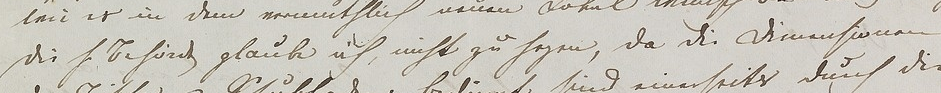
die h. Behörde, glaube ich, nicht zu hegen, da die Dimensionen
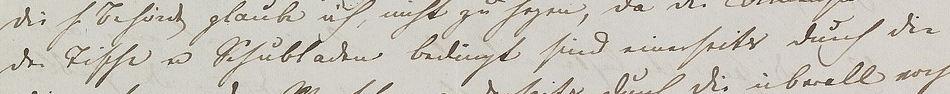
der Tische & Schubladen bedingt sind einerseits durch die
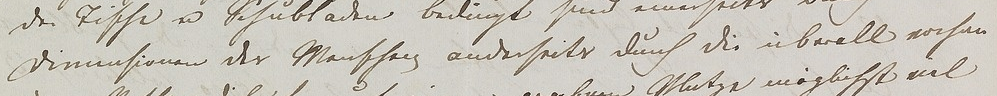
Dimensionen der Menschen, anderseits durch die überall vorhan-
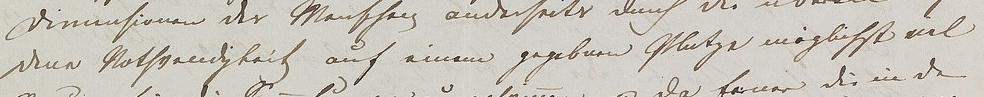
dene Nothwendigkeit auf einem gegebnen Platze möglichst viel
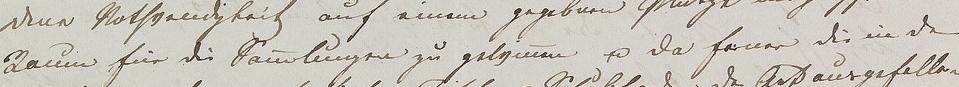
Raum für die Sammlungen zu gewinnen & da ferner die in der
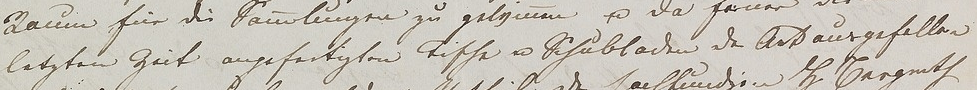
letzten Zeit angefertigten Tische & Schubladen der Art ausgefallen
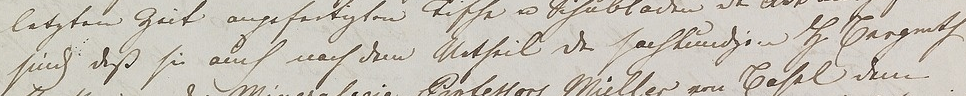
sind, daß sie auch nach dem Urtheil des sachkundigen H. Bergrath
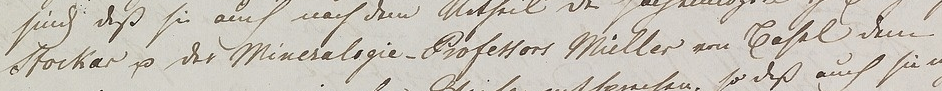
Stockar & des Mineralogie-Professors Müller von Basel dem
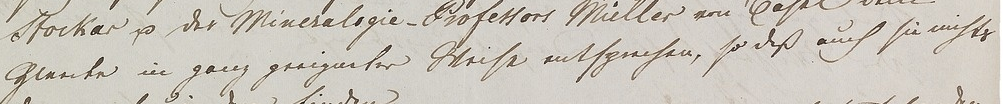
Zwecke in ganz geeigneter Weise entsprechen, so daß auch sie nichts
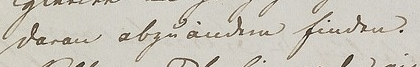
daran abzuändern finden.
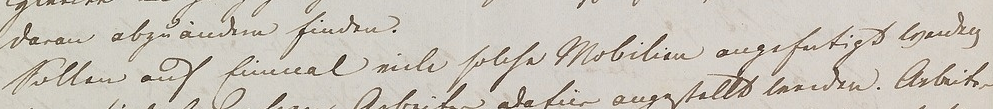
Sollen auf Einmal viele solche Mobilien angefertigt werden,
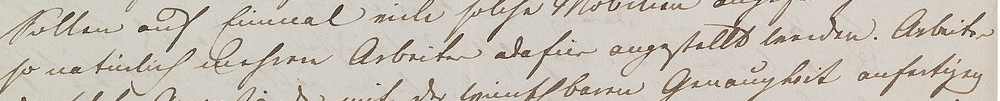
so natürlich mehrere Arbeiter dafür angestellt werden. Arbeiter,
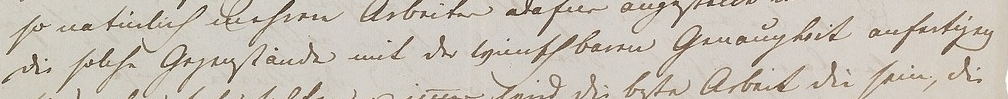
die solche Gegenstände mit der wünschbaren Genaugkeit anfertigen,
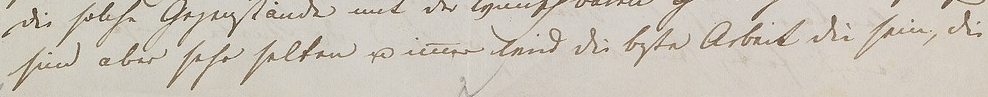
sind aber sehr selten & immer wird die beste Arbeit die sein, die
